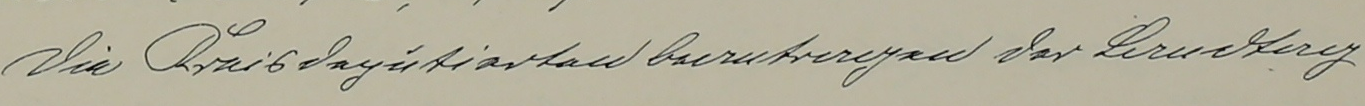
Die Kreisdeputierten beantragen der Landtag
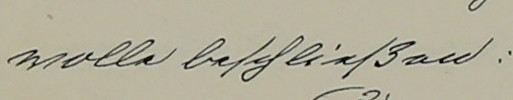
wolle beschließen:
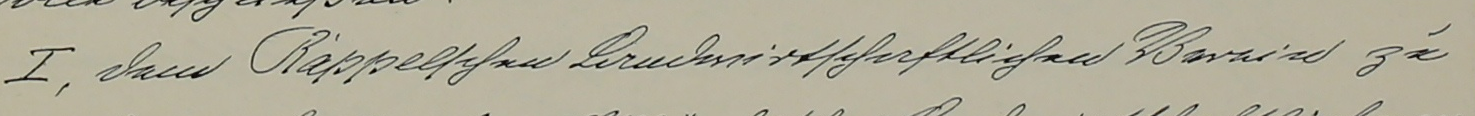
I. dem Rappelschen Landwirtschaftlichen Verein zu
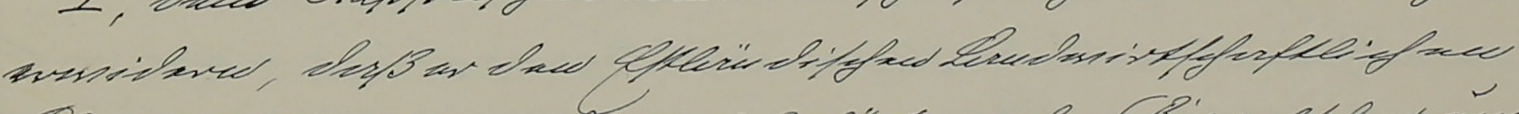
erwidern, daß er den Estländischen Landwirtschaftlichen
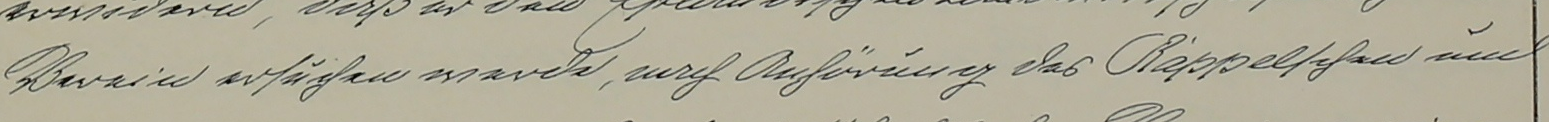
Verein ersuchen werde, nach Anhörung des Rappelschen und
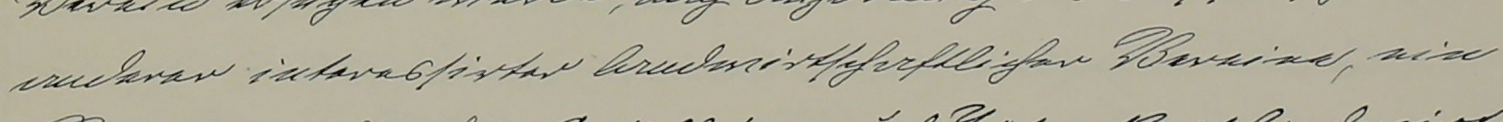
anderer interessirter landwirtschaftlicher Vereine, ein
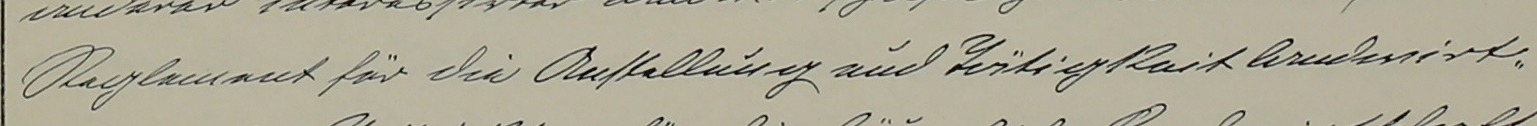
Reglement für die Anstellung und Tätigkeit landwirt-
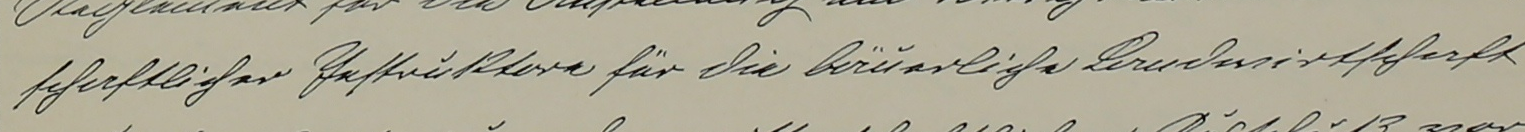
schaftlicher Instruktore für die bäuerliche Landwirtschaft
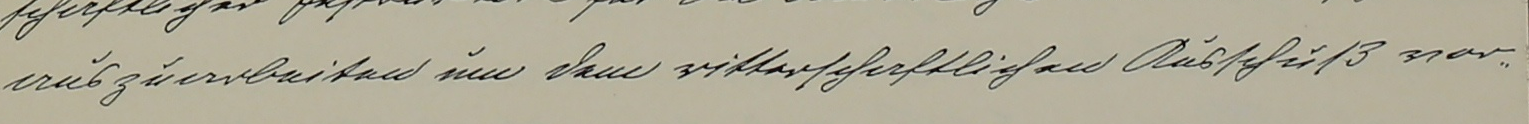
auszuarbeiten um dem ritterschaftlichen Ausschuß vor-
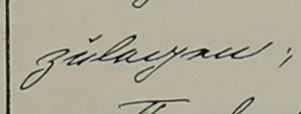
zulegen;
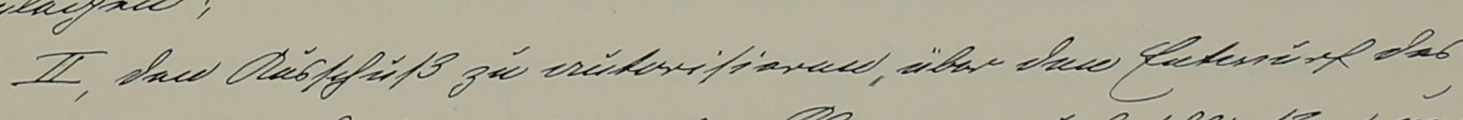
II. den Ausschuß zu autorisieren, über den Entwurf des
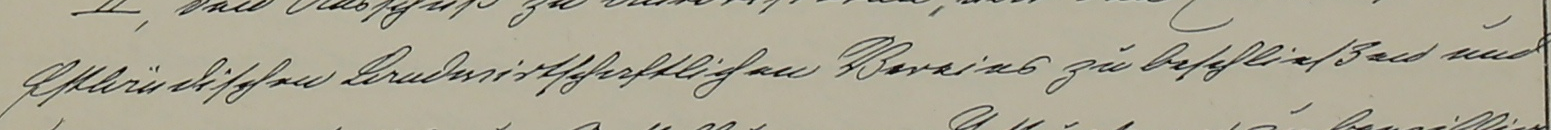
Estländischen Landwirtschaftlichen Vereins zu beschließen und
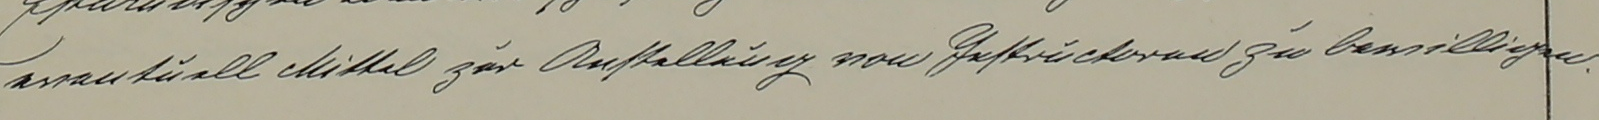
eventuell Mittel zur Anstellung von Instruktoren zu bewilligen.
